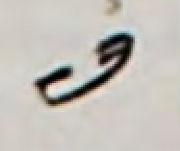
3
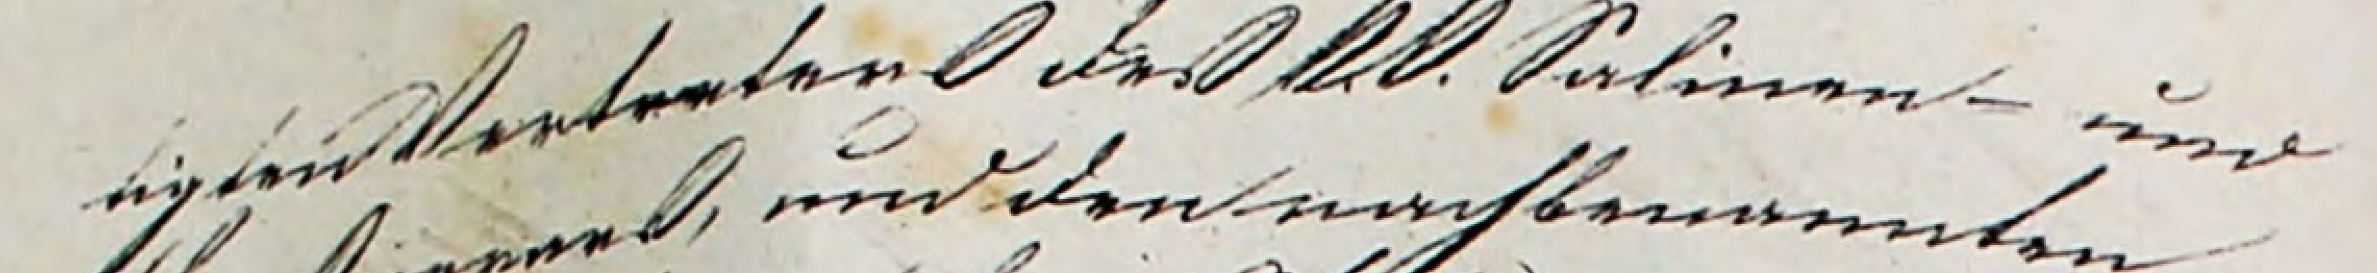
tigten Vertreters des kk. Salinen- und
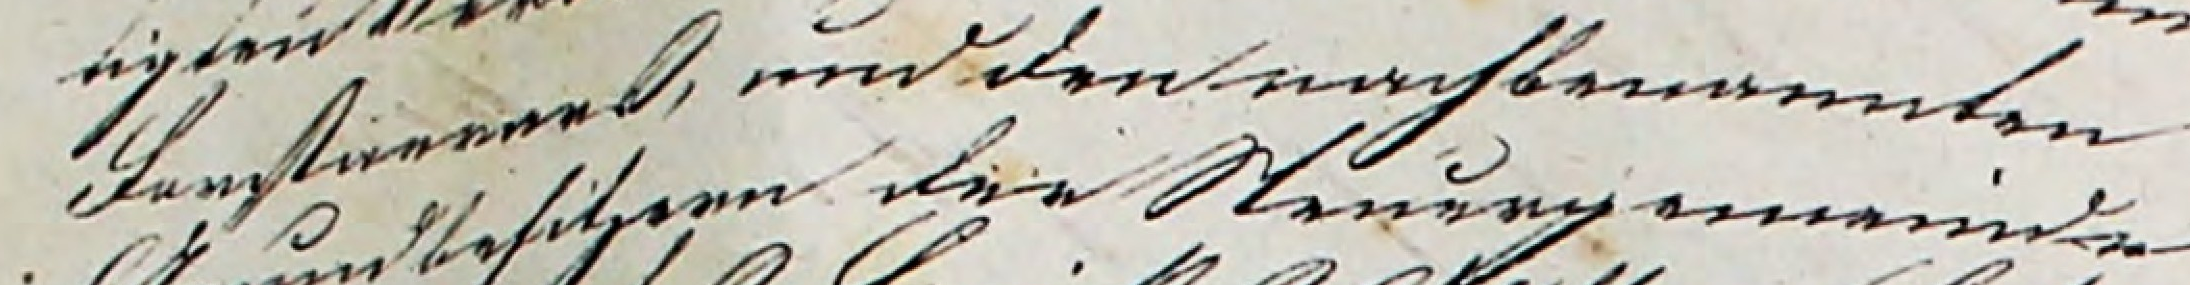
Forstaerars, und den nach benannten
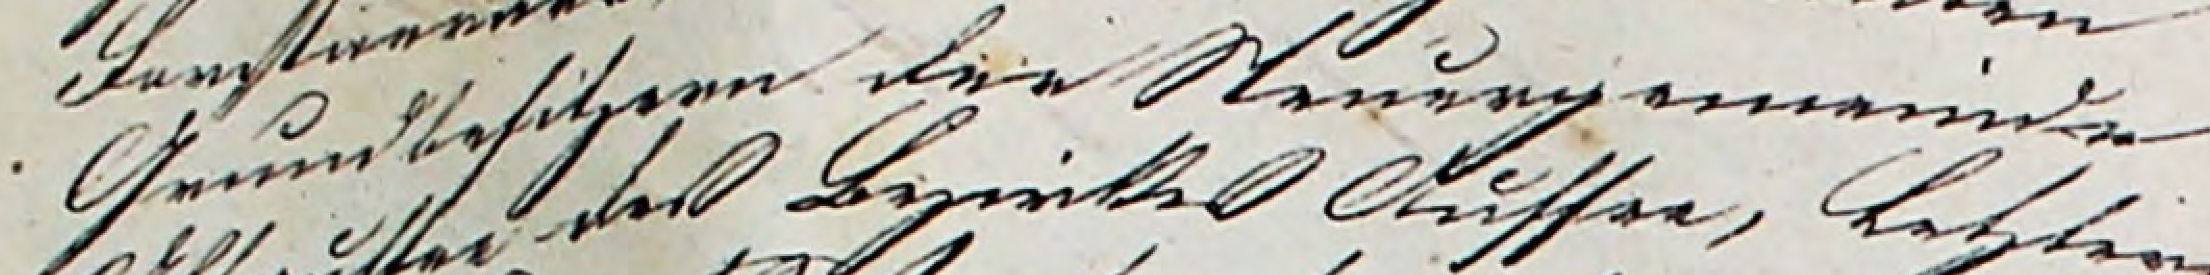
Grundbesitzern der Neuergemeinde
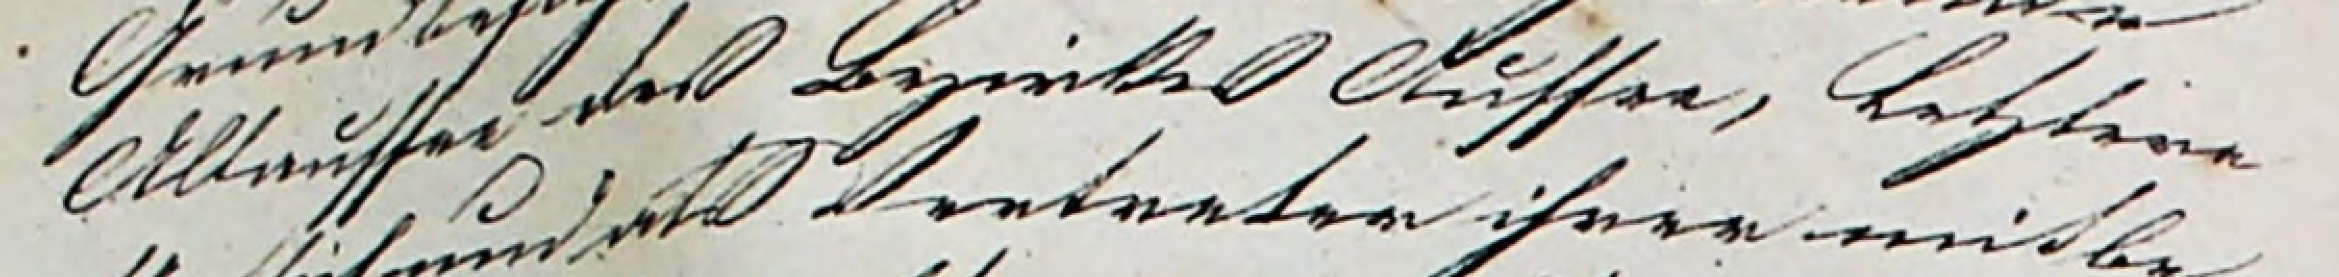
Altaussee des Bezirkes Aussee, letztere
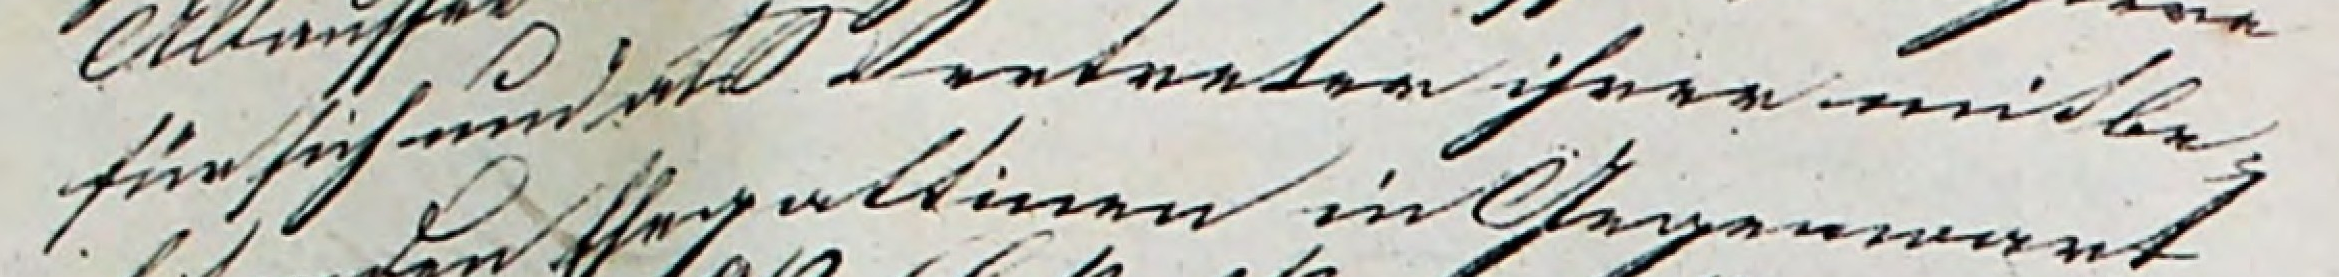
für sich und als Vertreter ihrer mitbe„
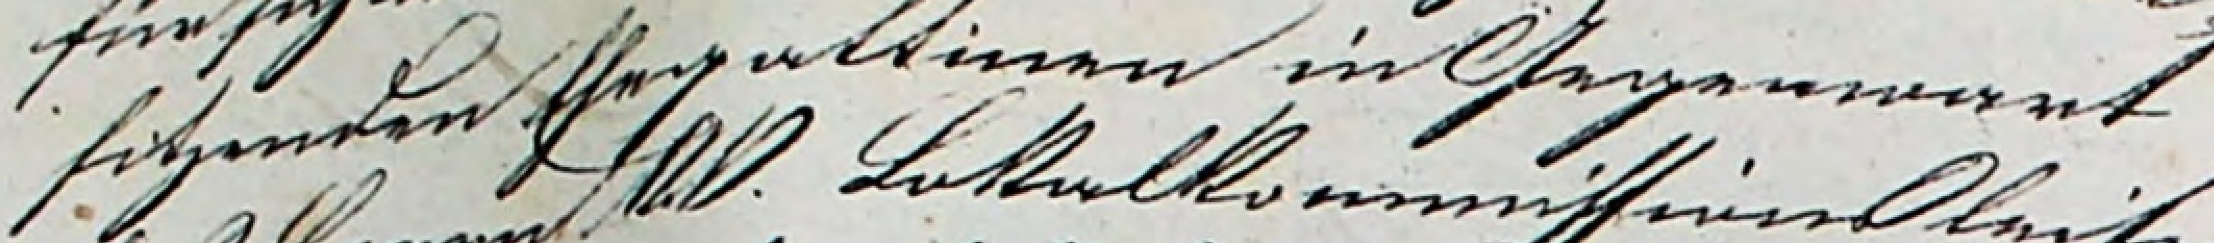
sitzenden Ehegattinen in Gegenwart
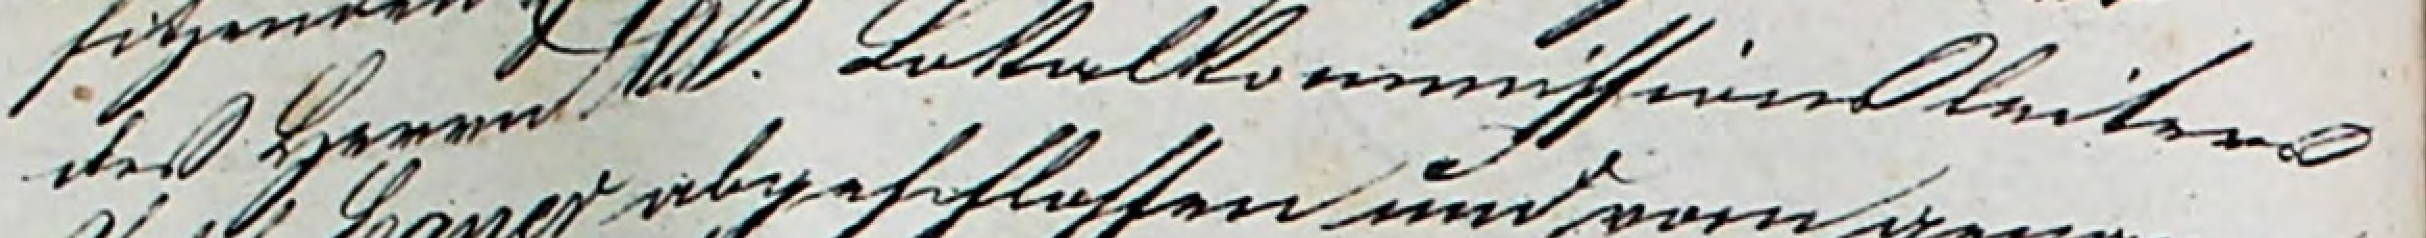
des Herrn W. Lokalkommissionsleiters
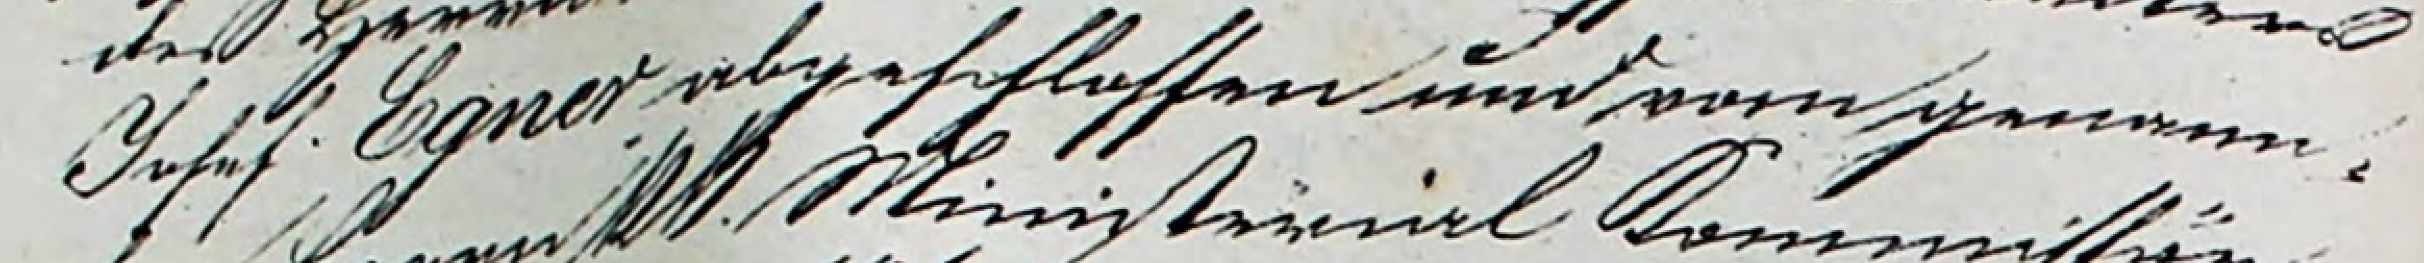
Josef. Egner abgeschlossen und vom genann„
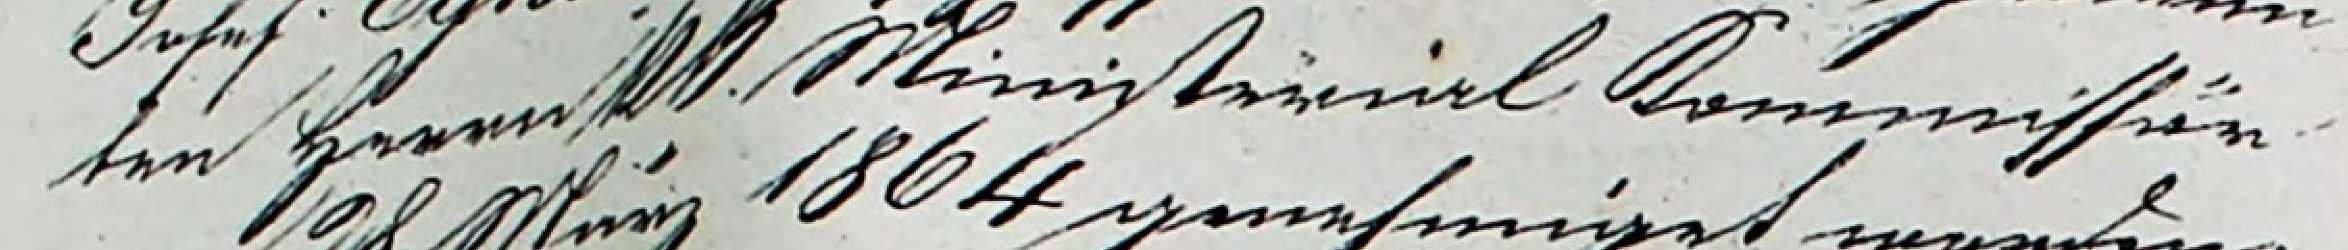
ten Herrn kk. Ministerial Kommissär
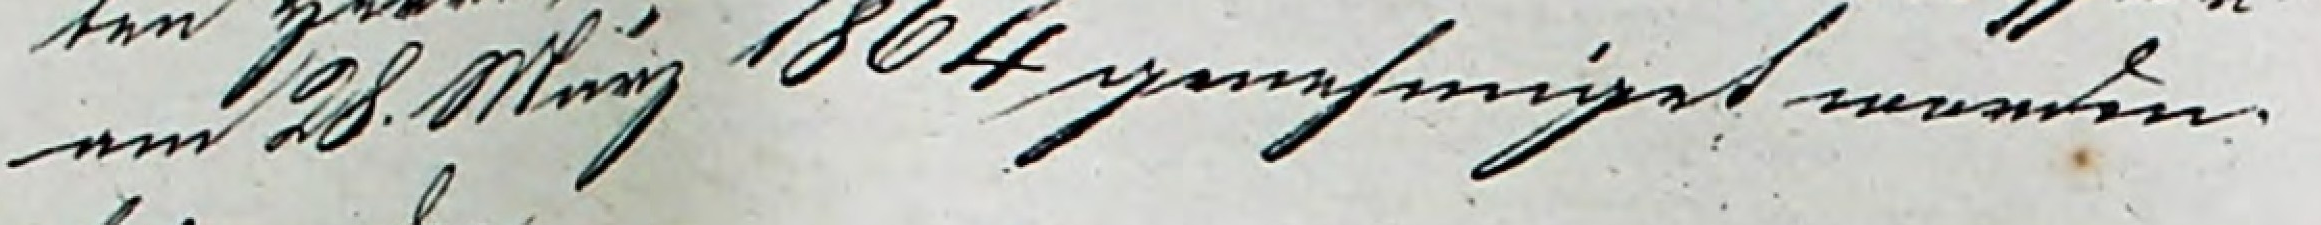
am 28. März 1864 genehmiget worden
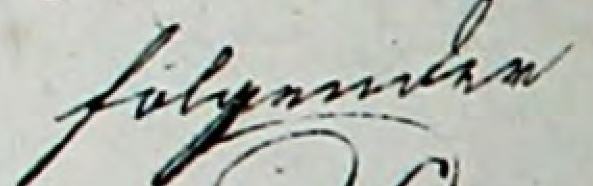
folgender
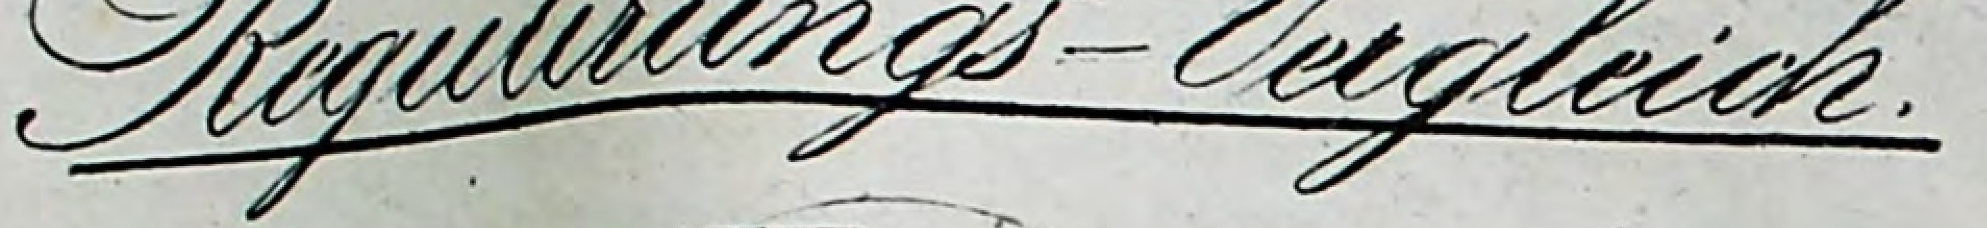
Regulirungs-Vergleich.
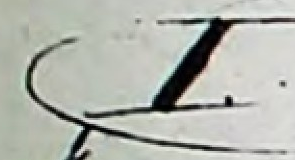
I.
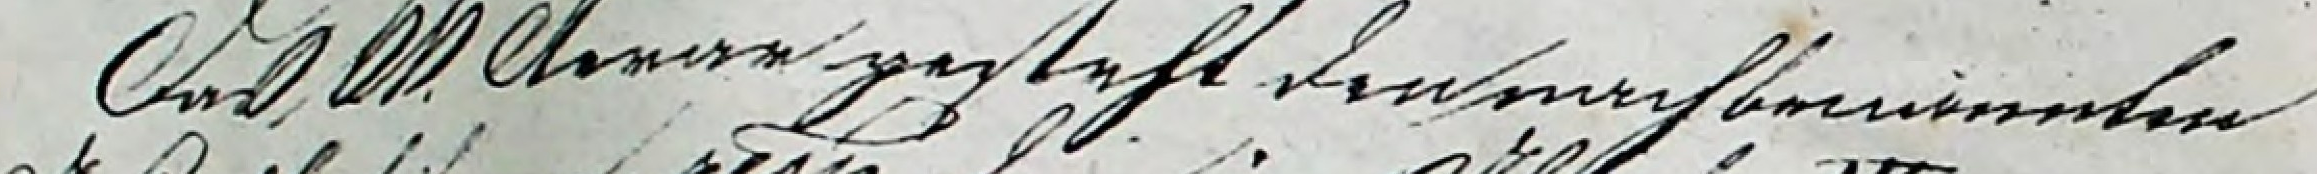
Das kk. Aerar gesteht den nach benannten
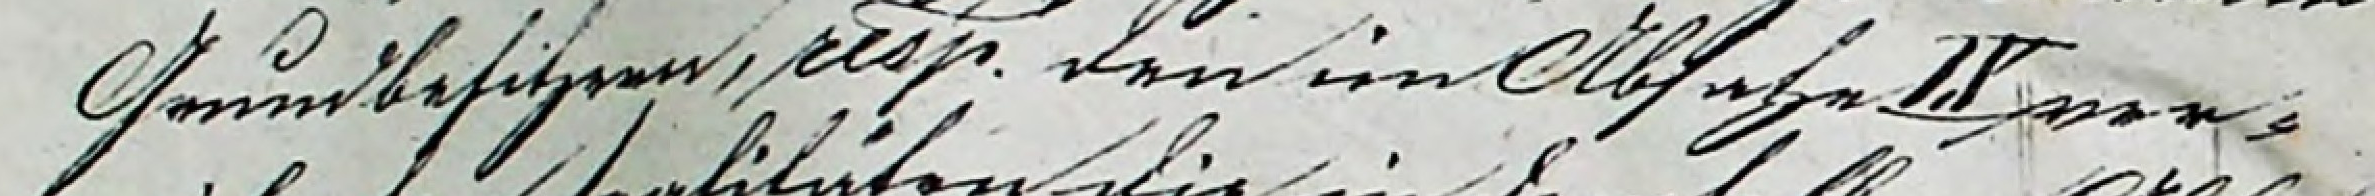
Grundbesitzen, resp. den im Absatze IX ver„
